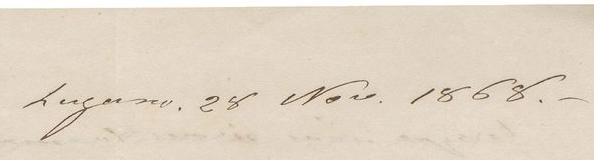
Lugano, 28 Nov. 1868. –
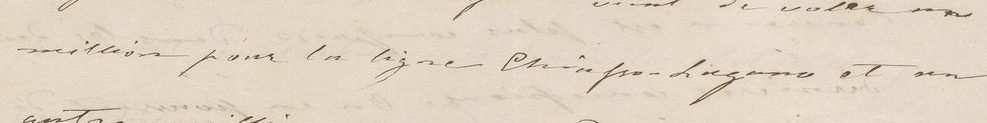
million pour la ligne Chiasso–Lugano et un
